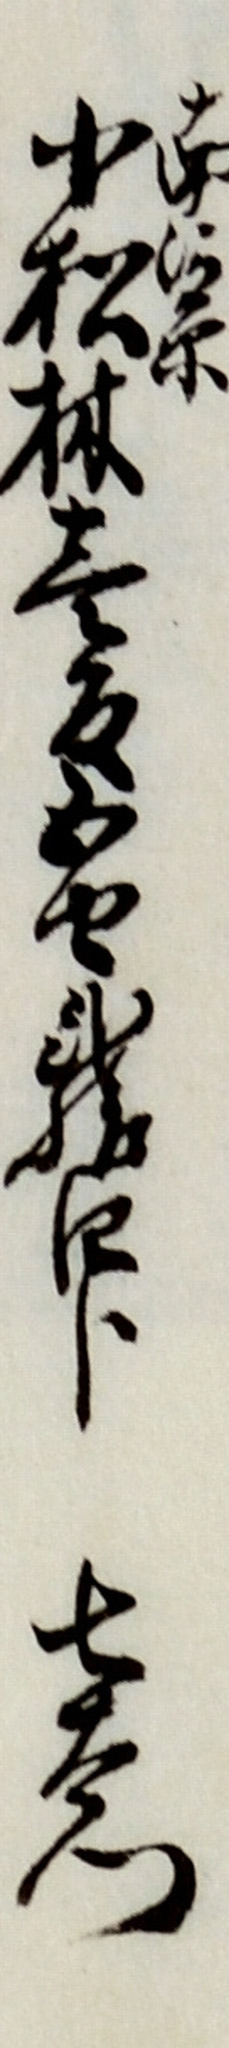小松林壱反五セ弐拾四歩七右衛門
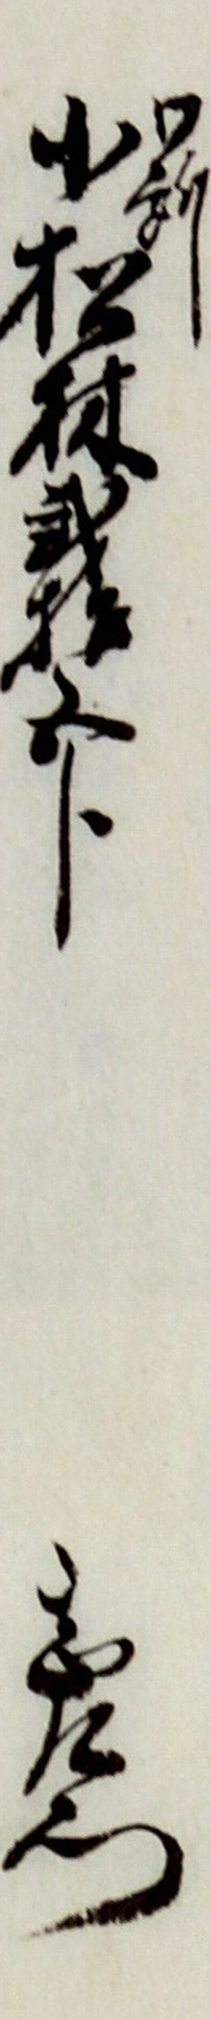小松林弐拾五歩甚左衛門
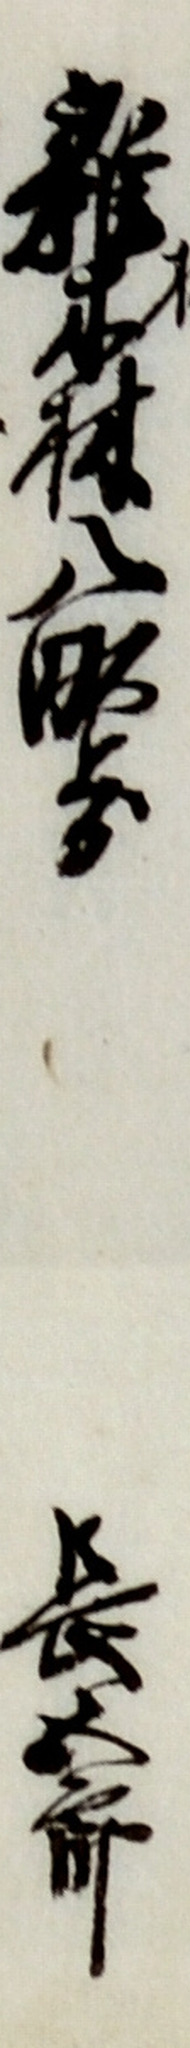雑木林八畝歩長五郎
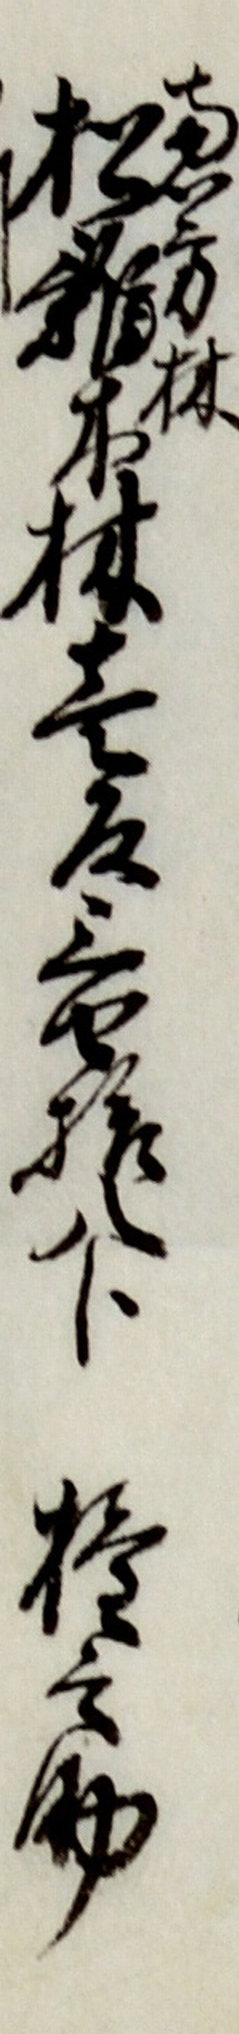松雑木林壱反三セ拾八歩権之助
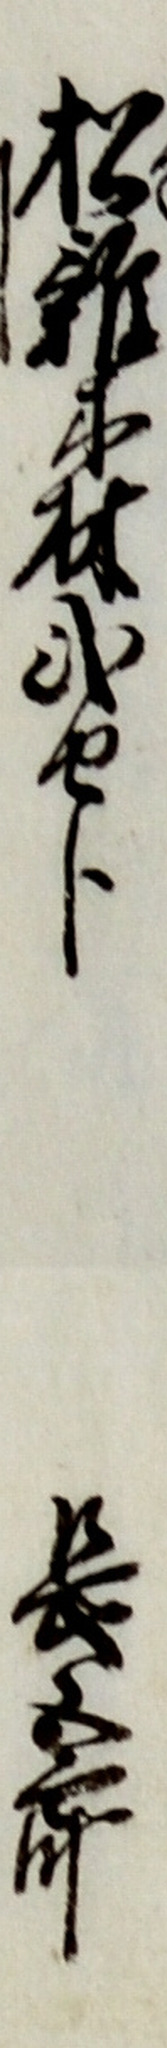松雑木林弐セ歩長五郎
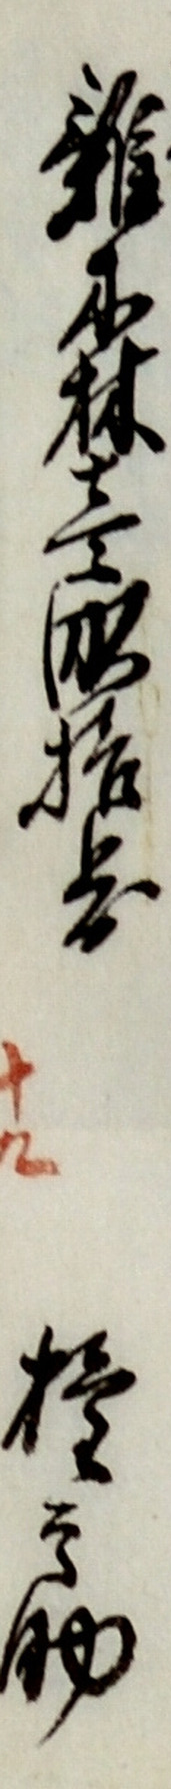雑木林壱畝拾歩権之助

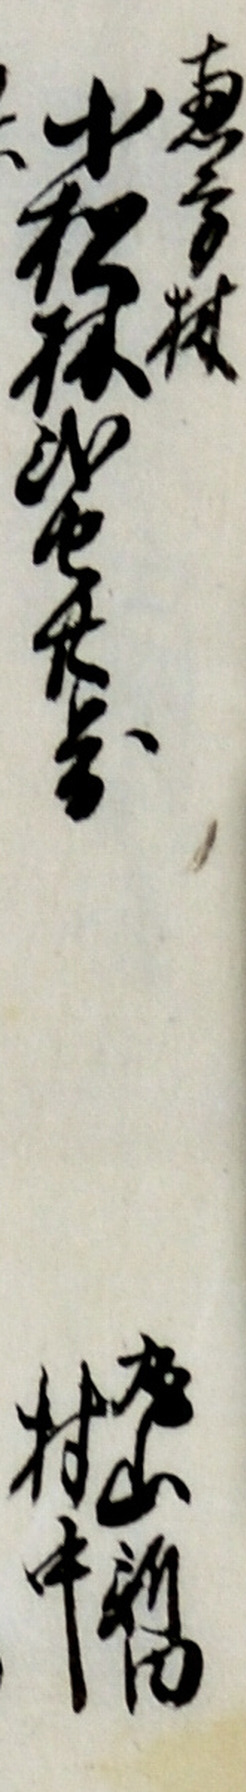小松林弐セ廿歩村中
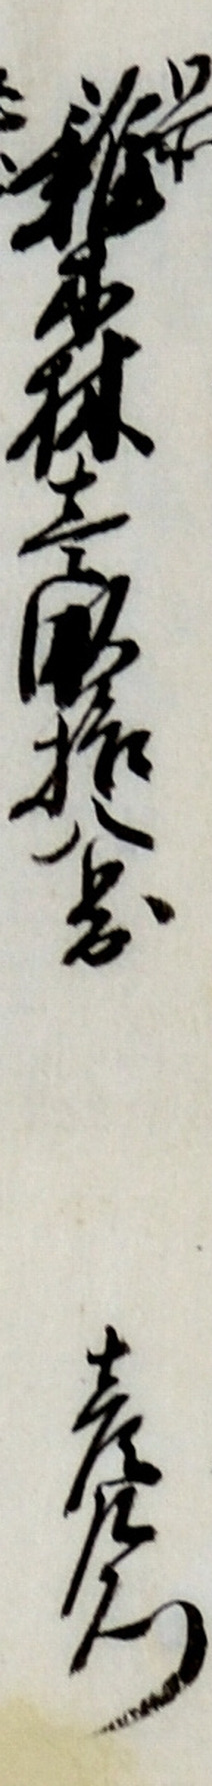雑木林壱畝拾八歩彦左衛門
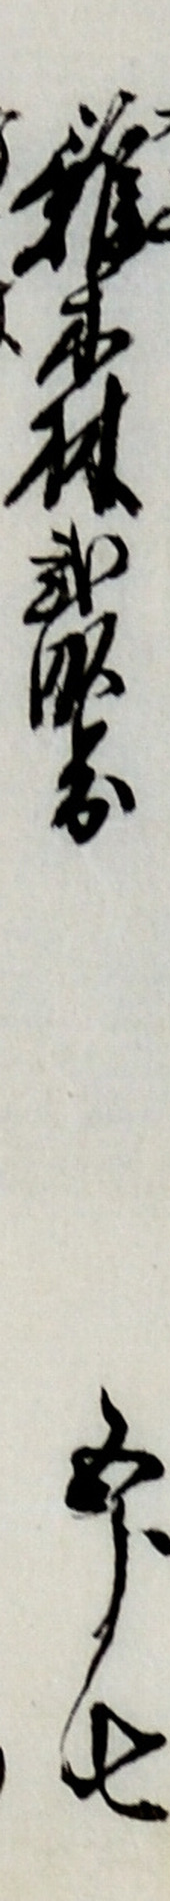雑木林弐畝歩五郎七
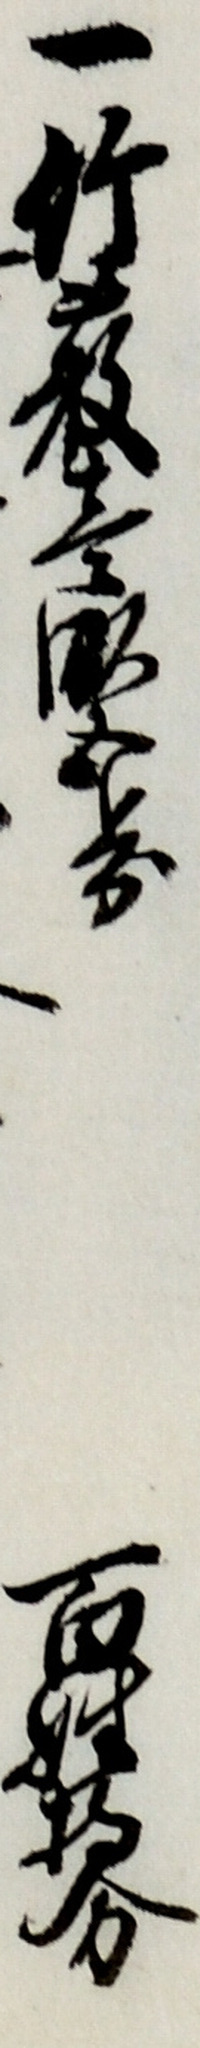一竹藪壱畝五歩百姓持分
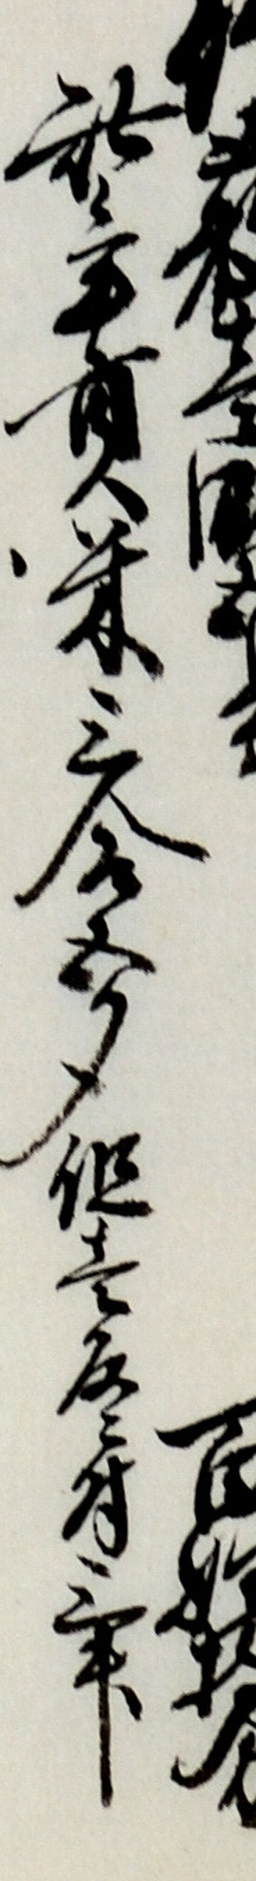此年貢米三合五勺〆但壱反ニ付三升
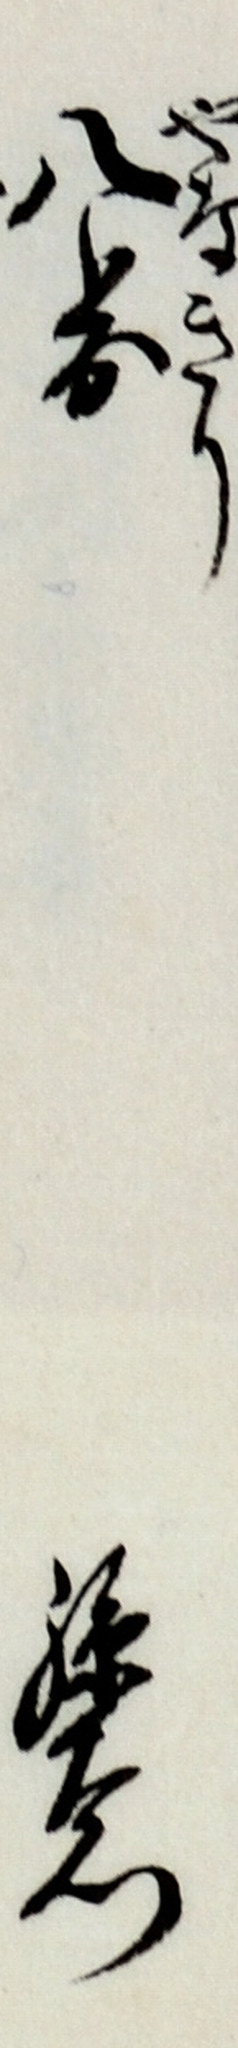八歩孫右衛門
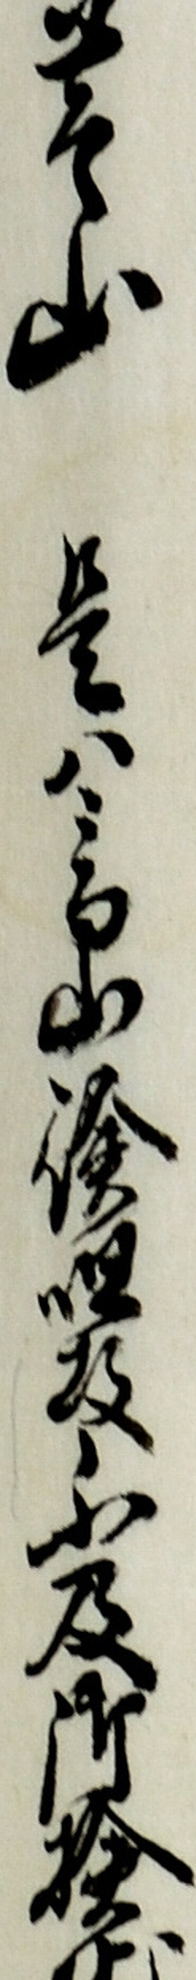一芝山是ハ高山嶮岨故不及御検地
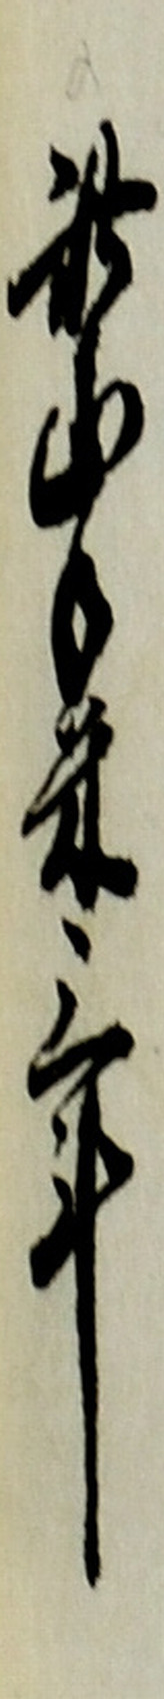此山手米三斗
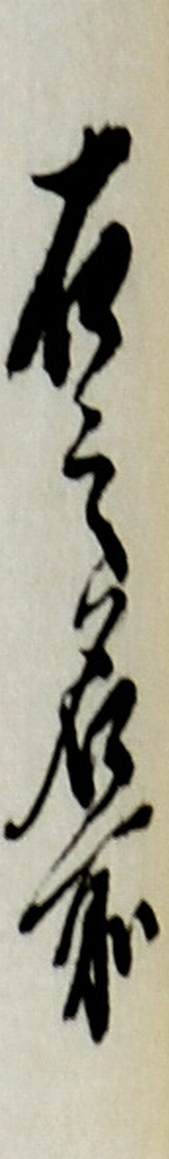右之名前
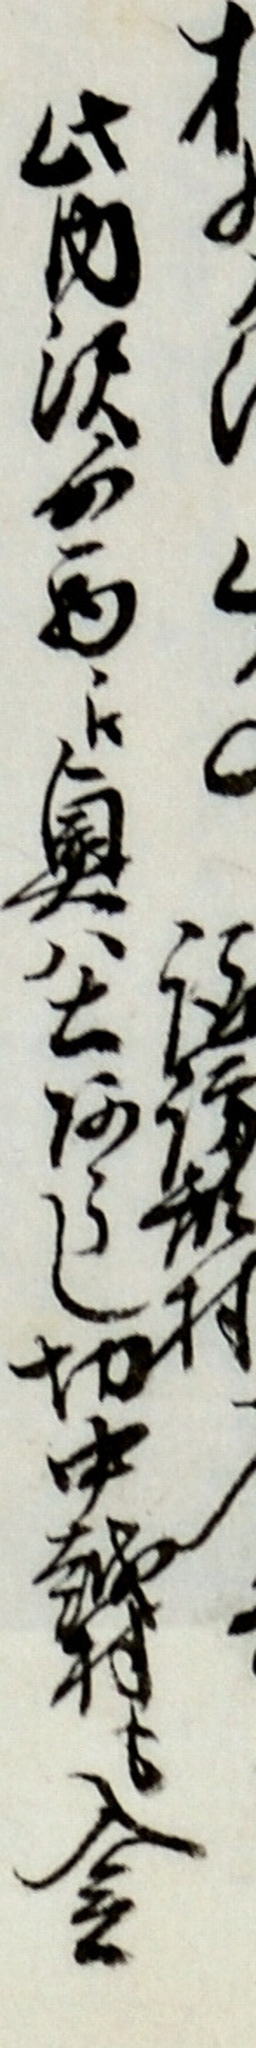此内沢より西え奥は土あらし切中越村も入会
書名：御領分中山林社地手控
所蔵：伊那市立高遠町図書館・合同会社AMANE
